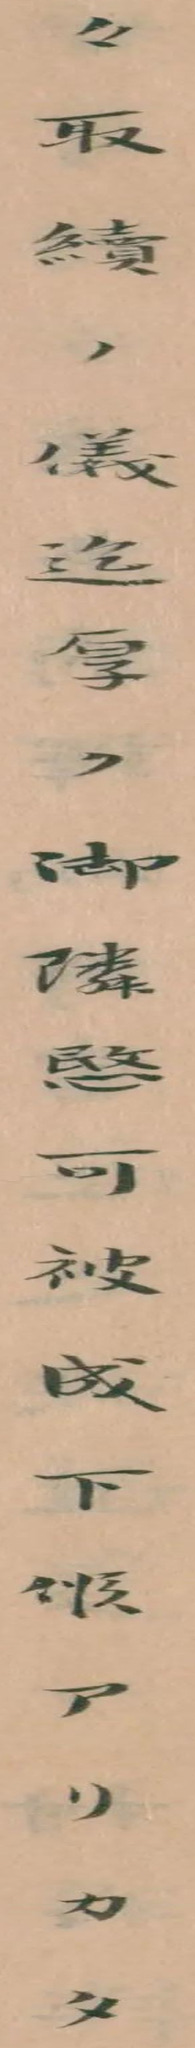々取続ノ儀迄厚ク御憐愍可被成下候アリカタ
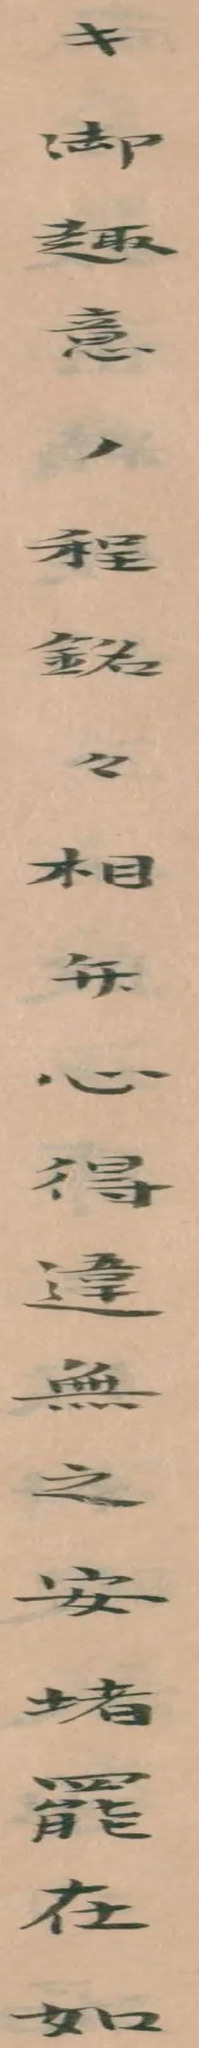キ御趣意ノ程銘々相弁心得違無之安堵罷在如
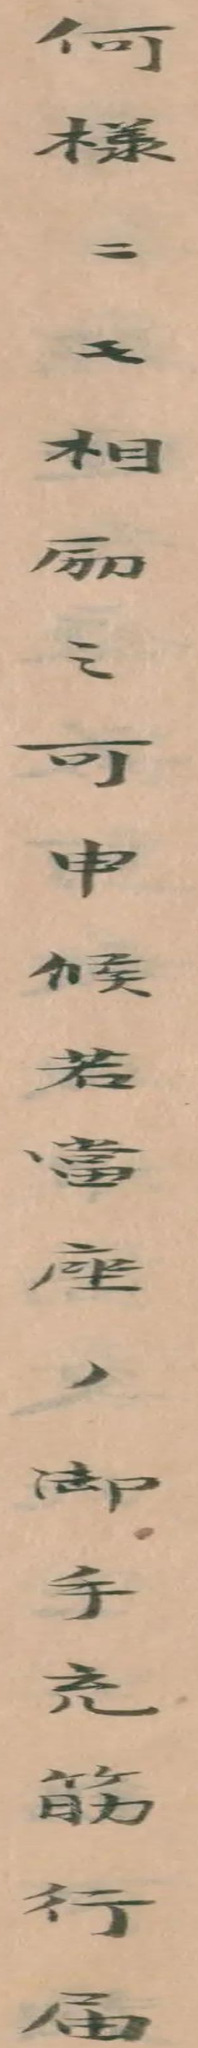何様ニモ相励ミ可申候若当座ノ御手充筋行届
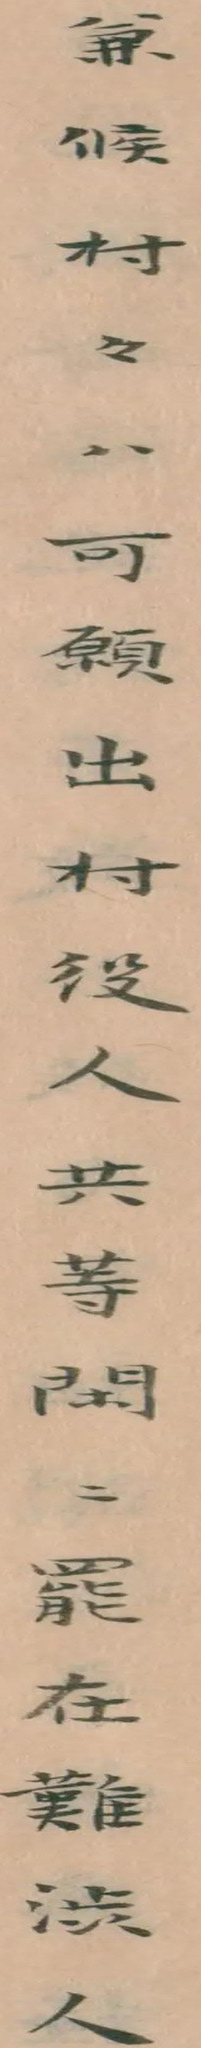兼候村々ハ可願出村役人共等閑ニ罷在難渋人
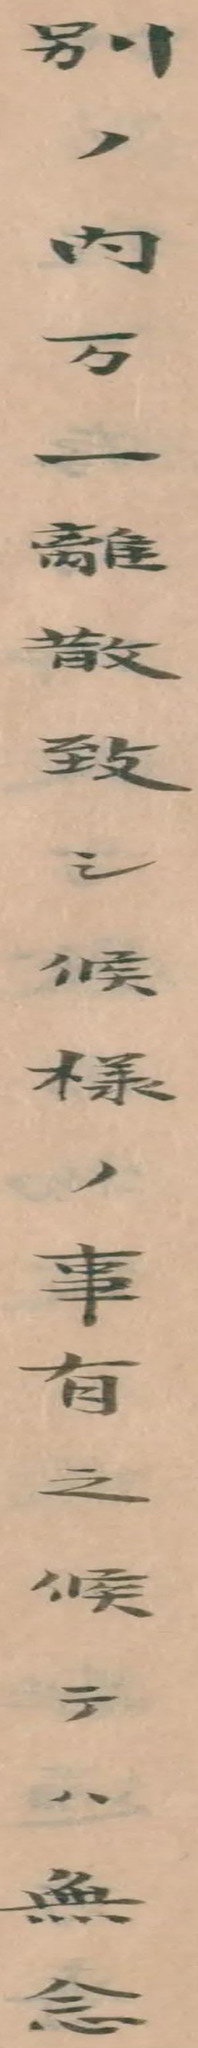別ノ内万一離散致シ候様ノ事有之候テハ無念
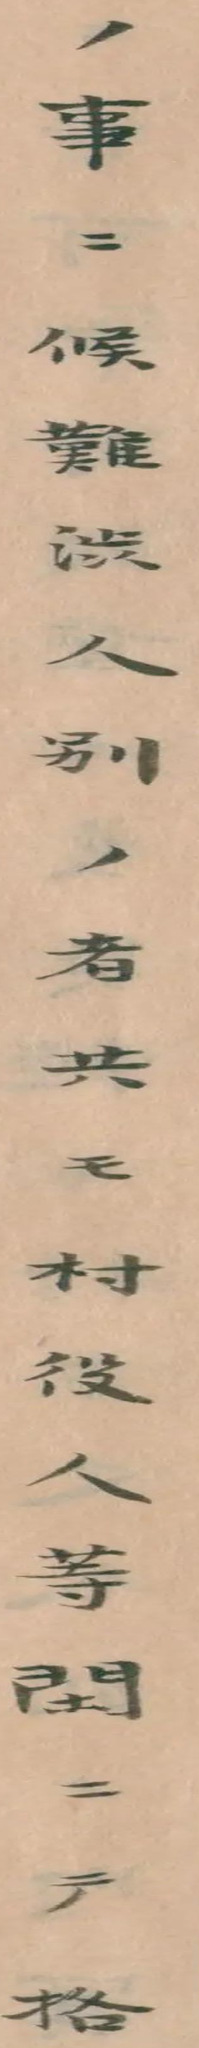ノ事ニ候難渋人別ノ者共モ村役人等閑ニテ格
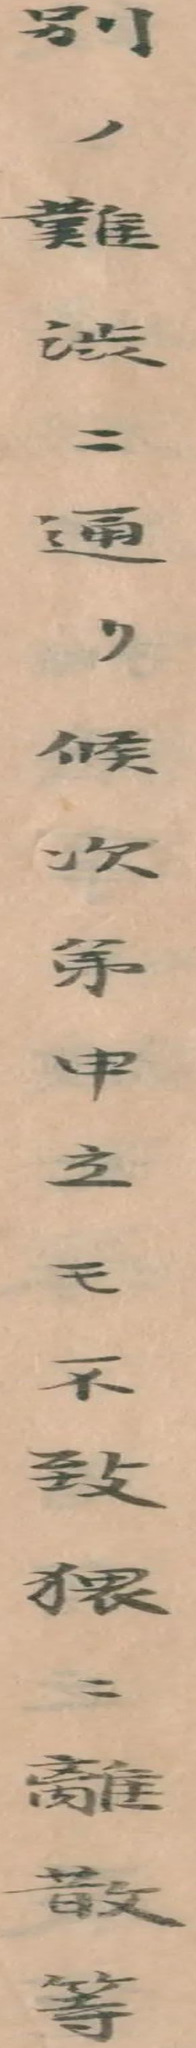別ノ難渋ニ通リ候次第申立モ不致猥ニ離散等

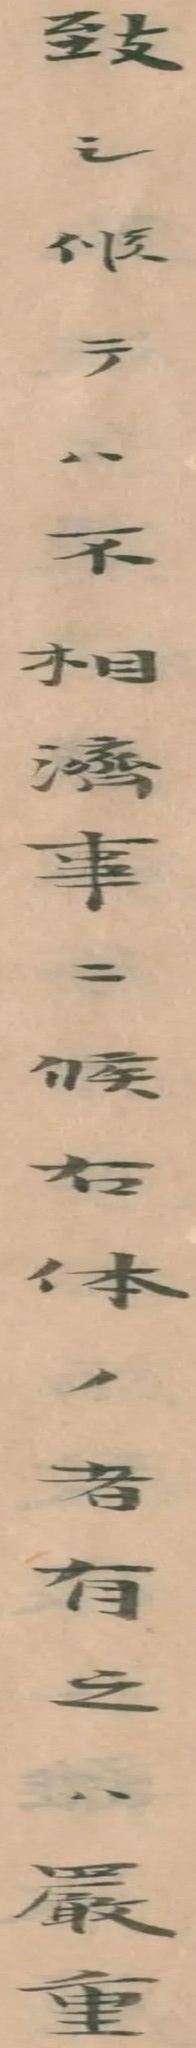致シ候テハ不相済事ニ候右体ノ者有之ハ厳重
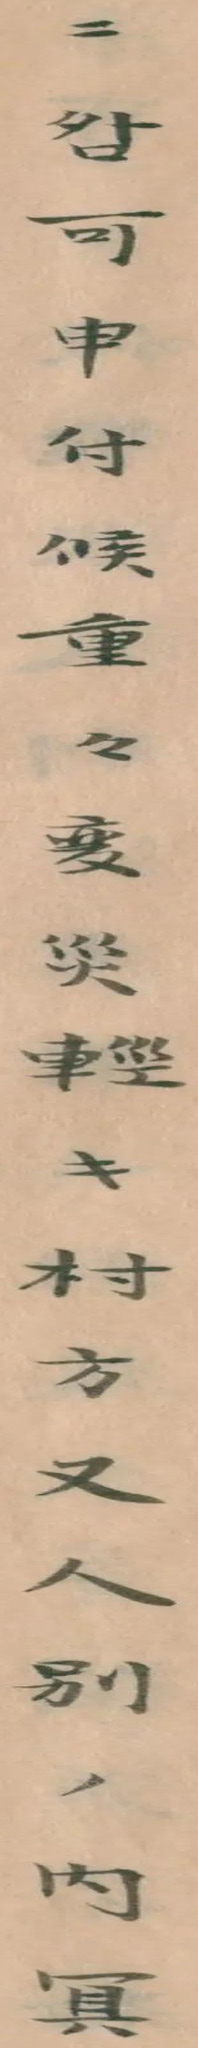ニ咎可申付候重々変災軽キ村方又人別ノ内冥
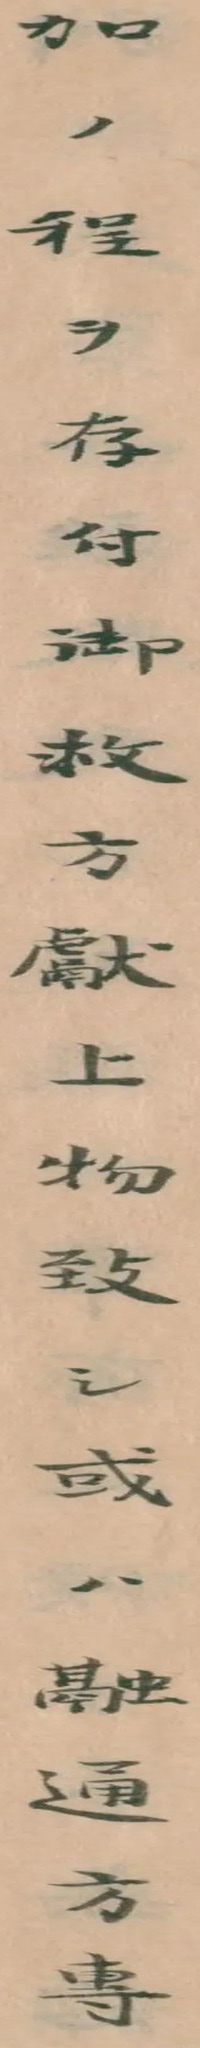加ノ程ヲ存付御救方献上物致シ或ハ融通方専
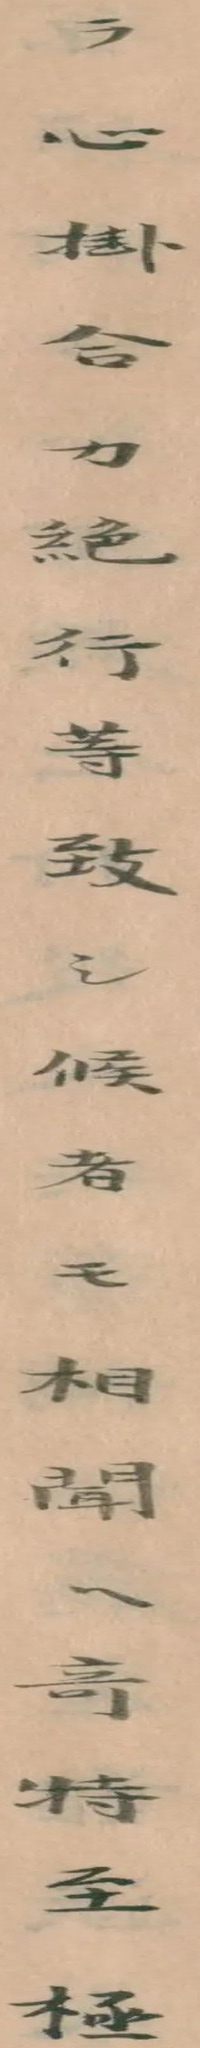ラ心掛合カ絶行等致シ候者モ相聞ヘ奇特至極
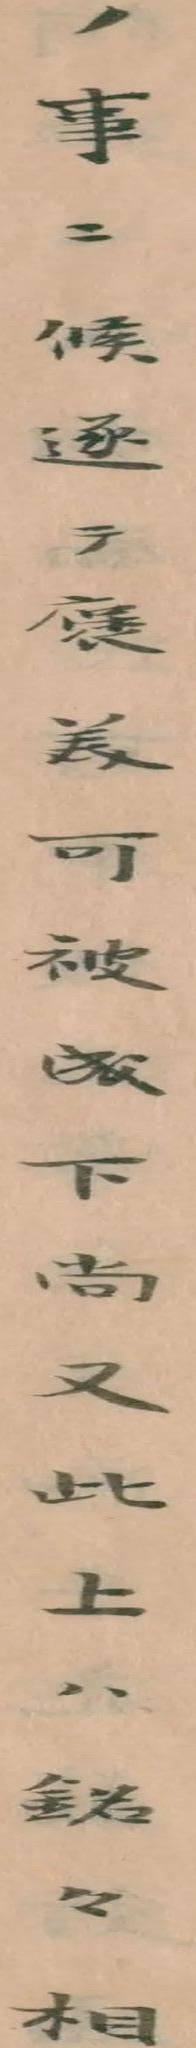ノ事ニ候逐テ褒美可被成下尚又此上ハ銘々相
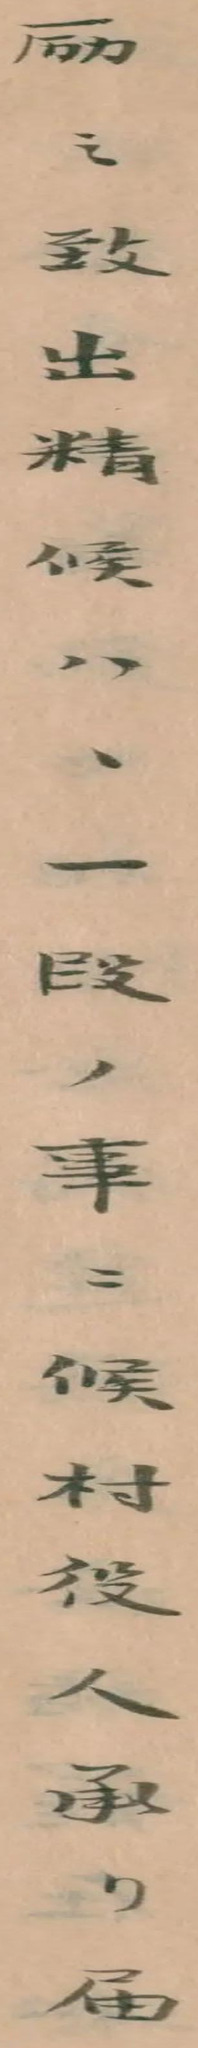励ミ致出精候ハヽ一段ノ事ニ候村役人承リ届
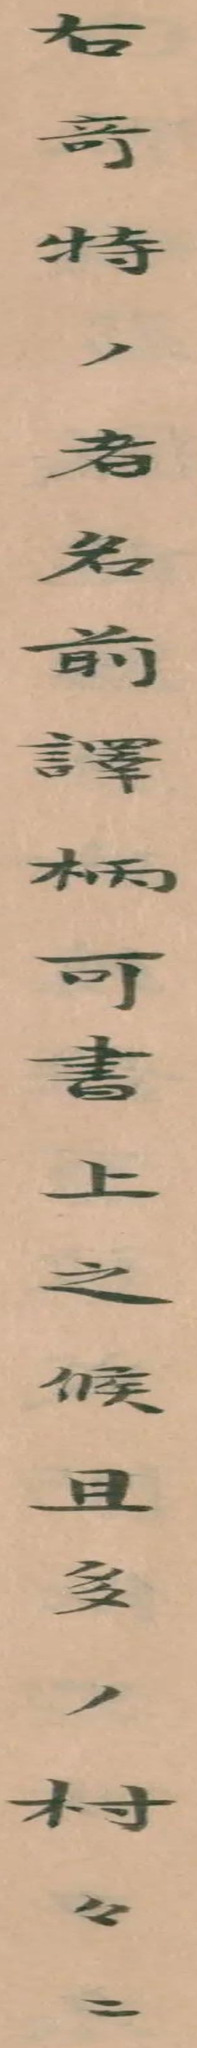右奇特ノ者名前訳柄可書上之候且多ノ村々ニ
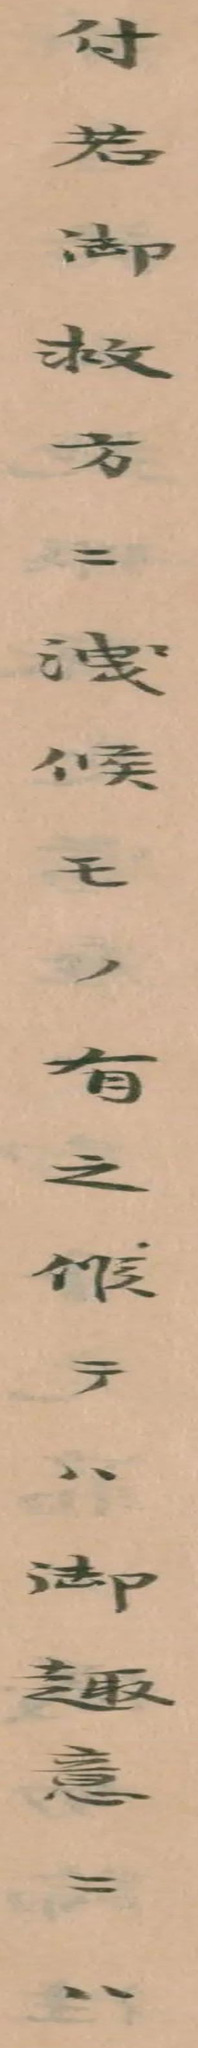付若御救方ニ洩候モノ有之候テハ御趣意ニハ
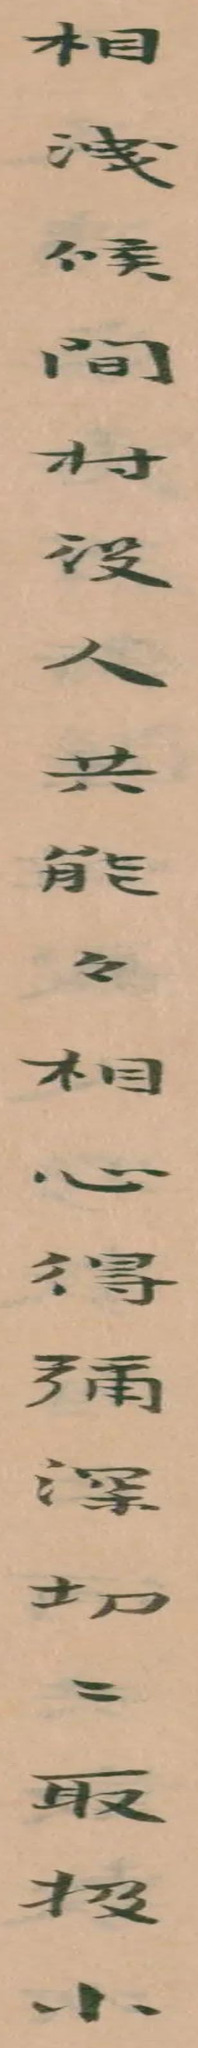相洩候間村役人共能々相心得弥深切ニ取扱小
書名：地災撮要. 巻5-6(地震之部)
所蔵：国立国会図書館 National Diet Library, JAPAN
